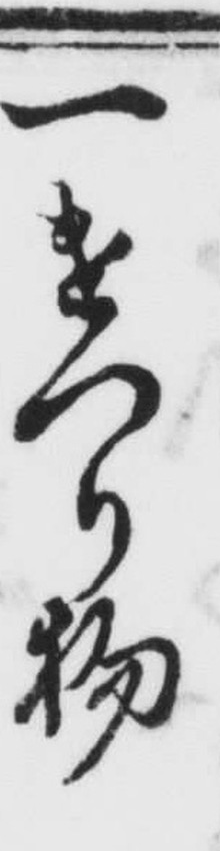一けつり物
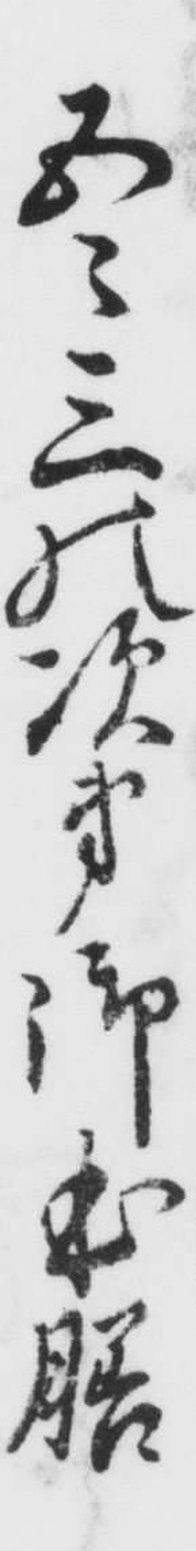五々三の次第御本膳
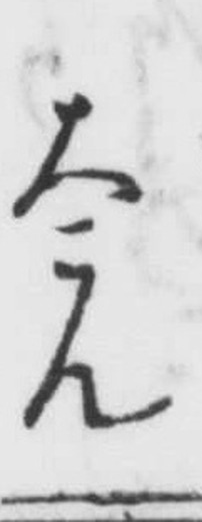大こん
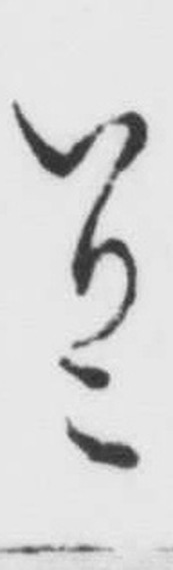いりこ

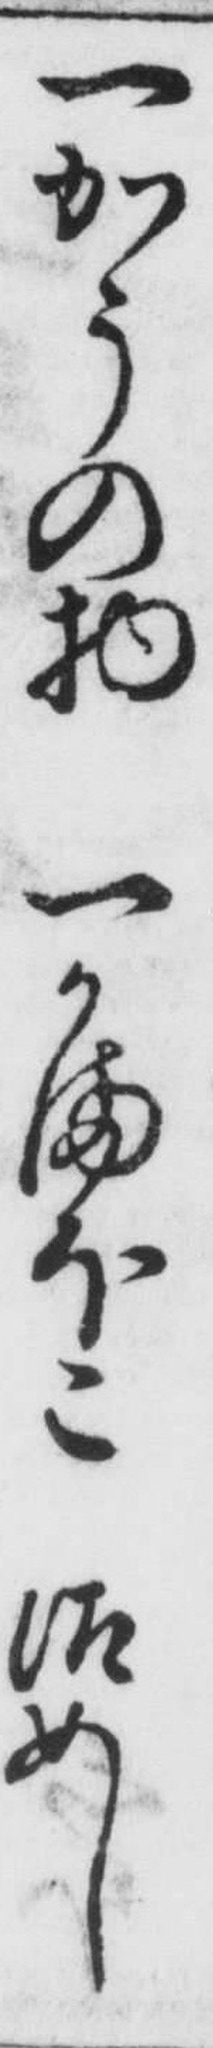一かうの物一かまほこ御めし
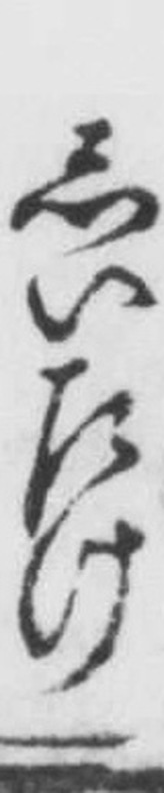しいたけ
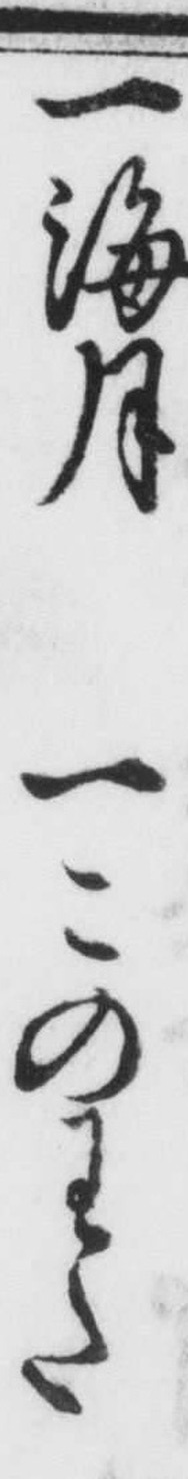一海月一このわた
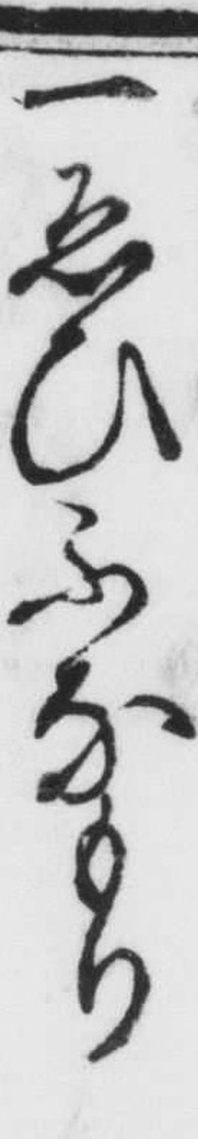一ゑひふなもり
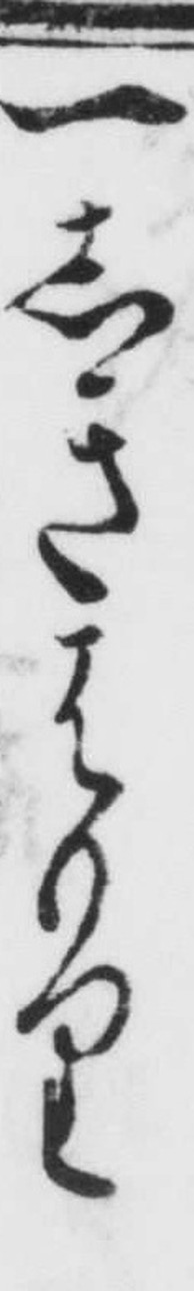一しきはもり
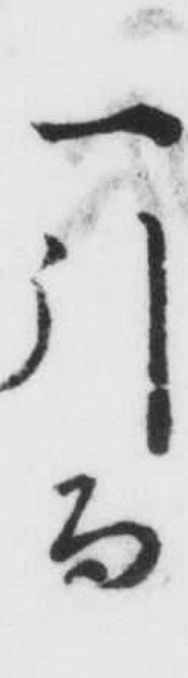一引な
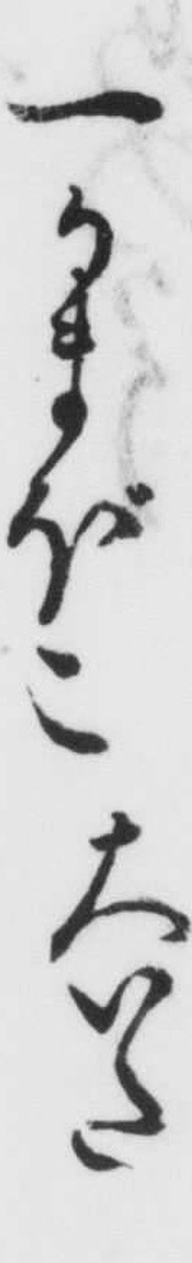一かまぼこ大いた
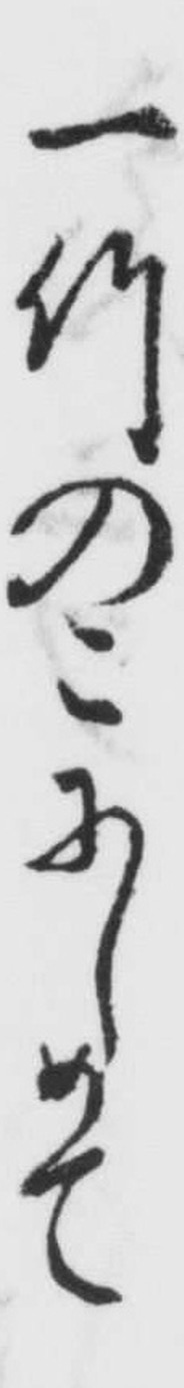一竹のこにしめて
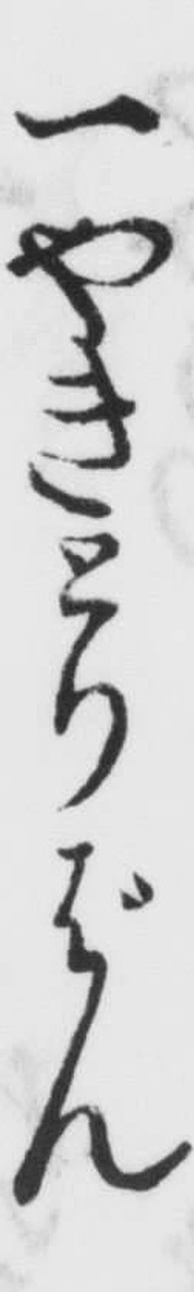一やきとりばん
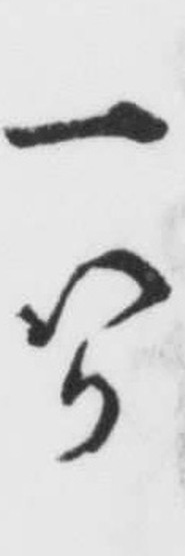一いか
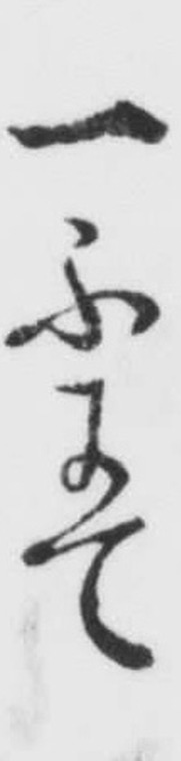一ふにて
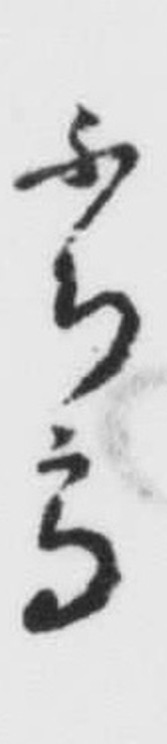ふち高
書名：料理切形秘伝抄
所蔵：大阪府立大学学術情報センター 国文学研究資料館
